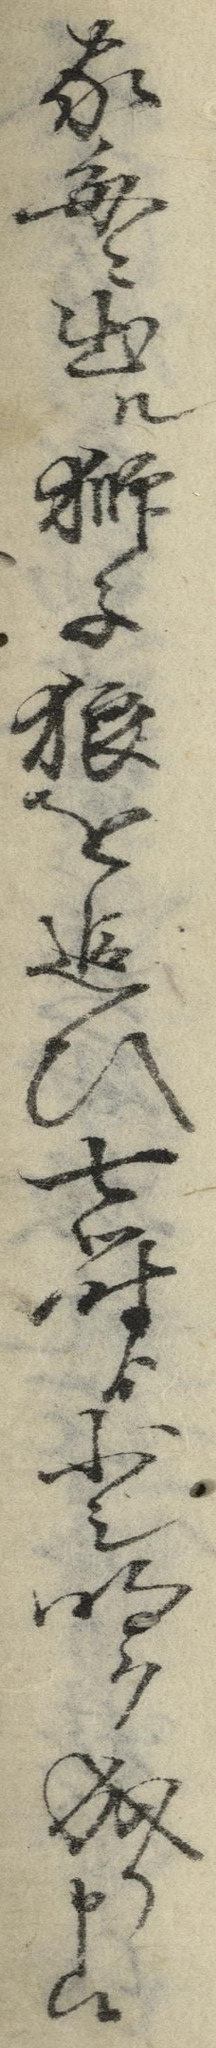家毎ニ出ル獅子狼を追ひ七ッ時ゟ少シ明ク成り申候

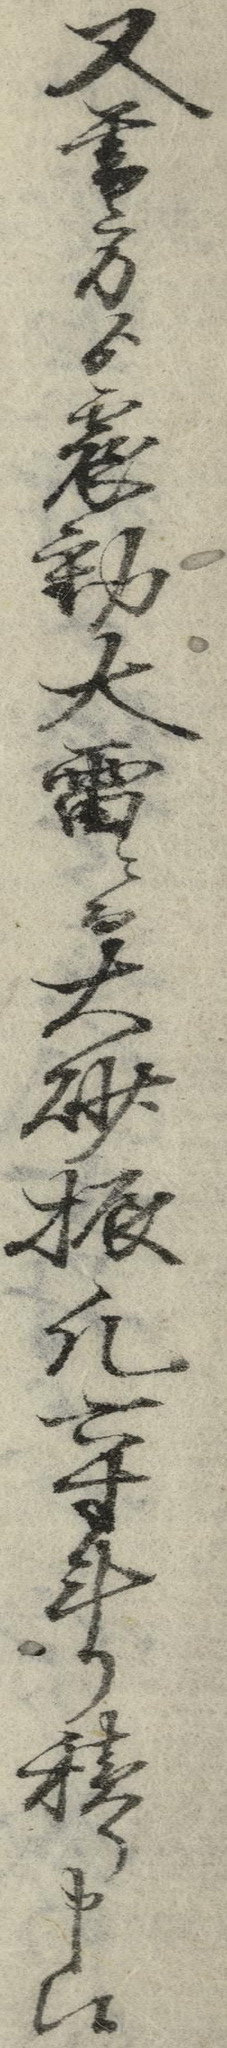又暮方ゟ震動大雷ニ而大砂振凡六寸斗り積り申候
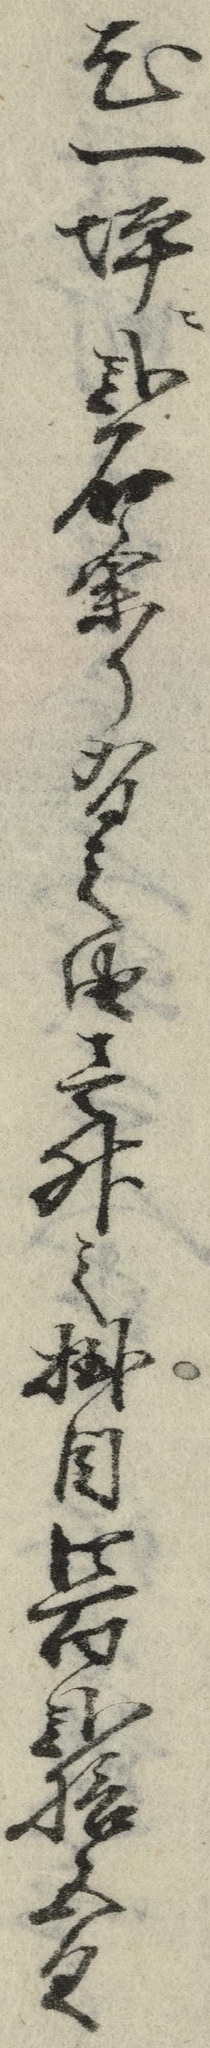尤一坪ニ弐石余り有之由其外之掛目四百弐拾五匁
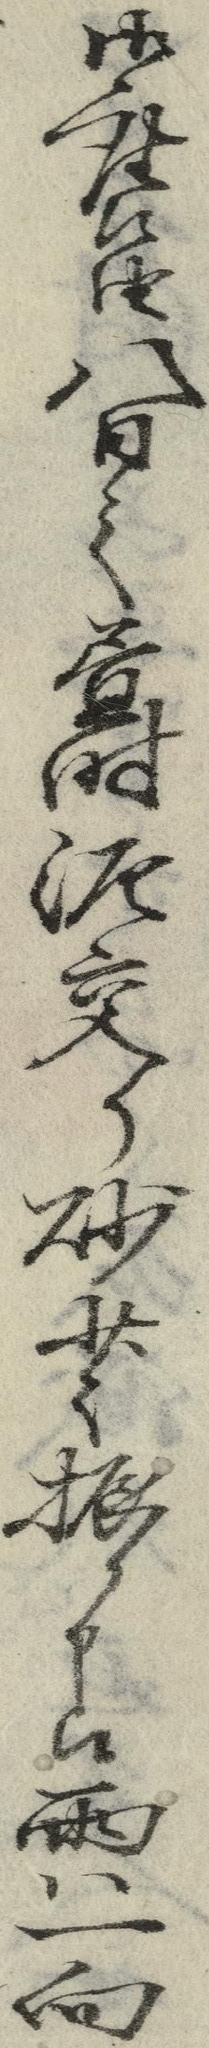御座候由八日之昼時泥交り砂少々振り申候雨ハ一向
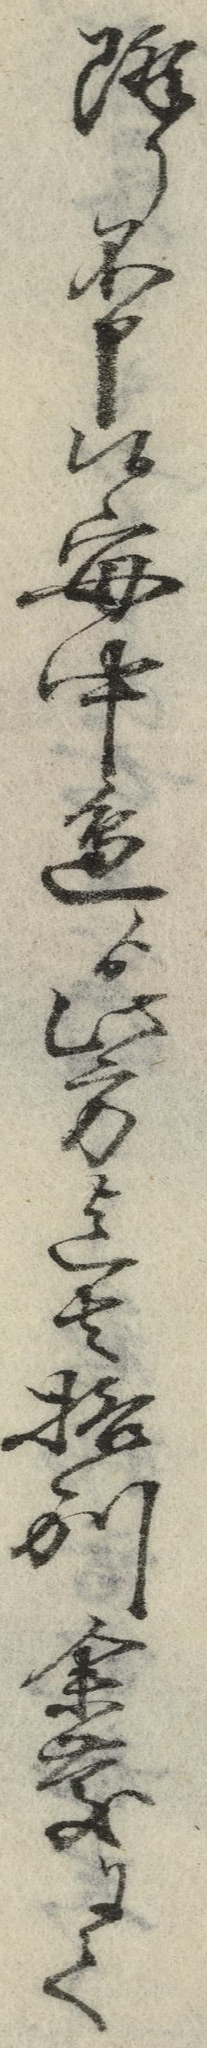降り不申候安中辺ゟ此方迄は格別余慶にて
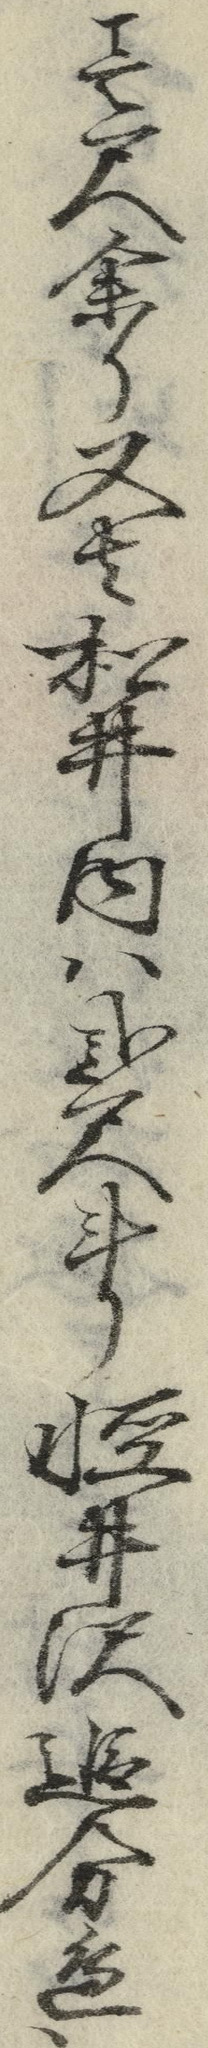壱尺余り又は松井内ハ弐尺斗り軽井沢追分辺ハ
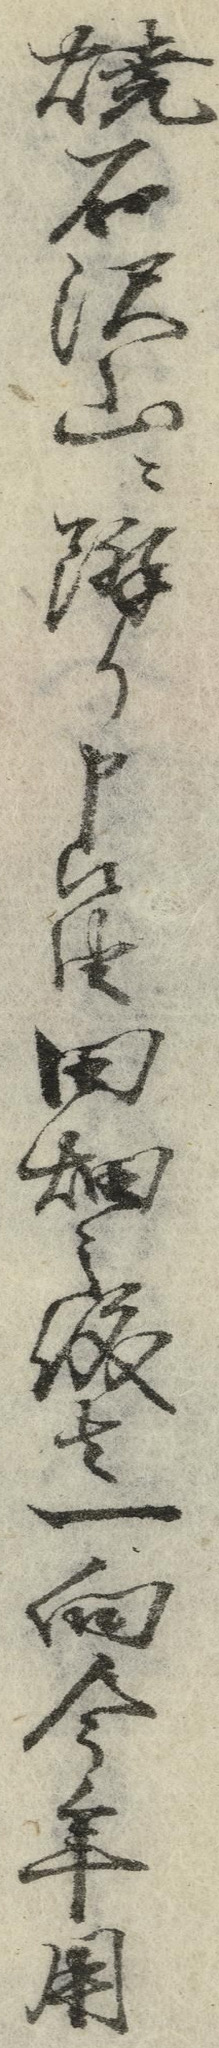焼石沢山ニ降り申候由田畑之儀は一向今年用
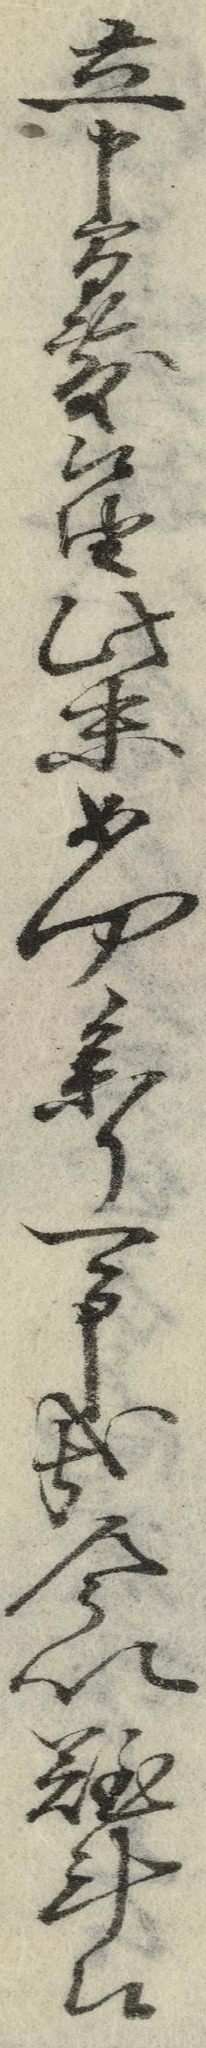立申間敷候由此末如何参り可申哉今以難斗候
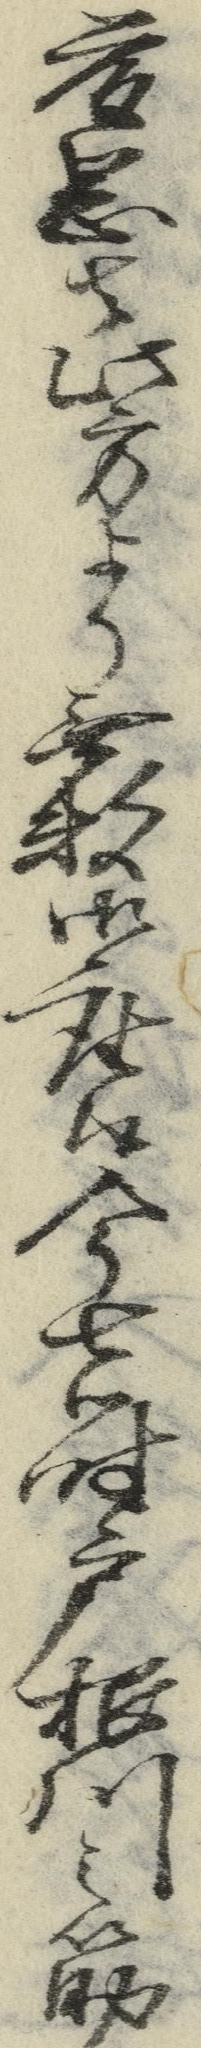藤岡は此方より無数御座候今七ッ時戸根川之筋
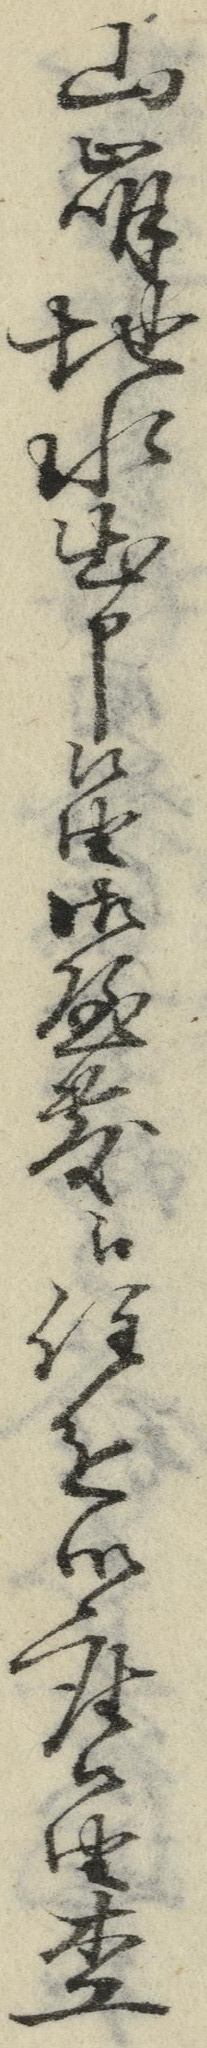山崩地水出申候由御屋敷江注進御座候由杢
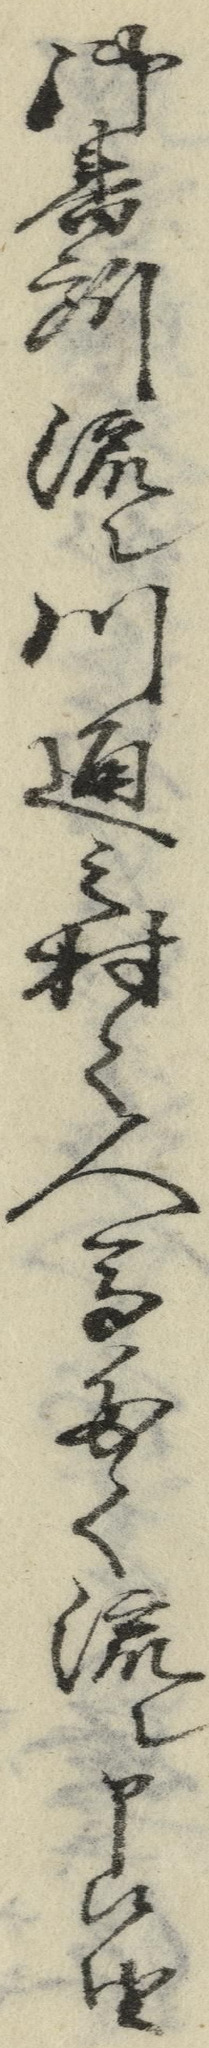御番所流レ川通之村々人馬多く流レ申候由
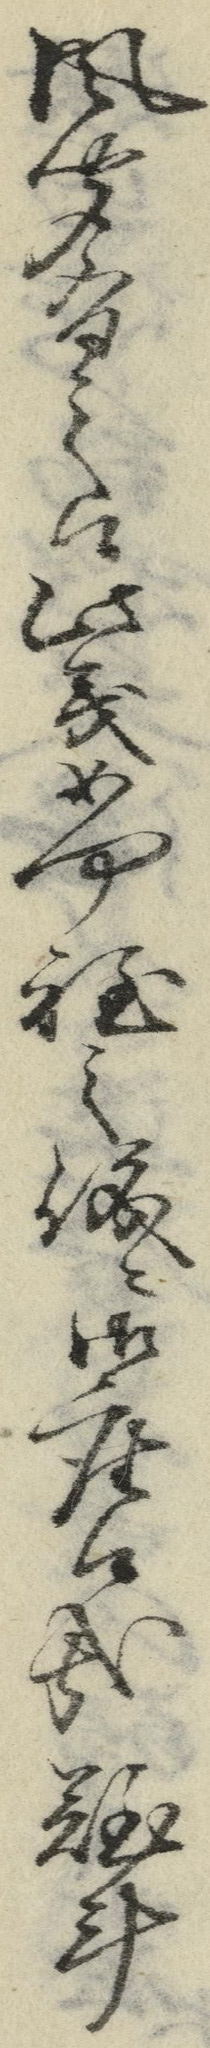風聞有之候此義如何程之儀ニ御座候哉難斗
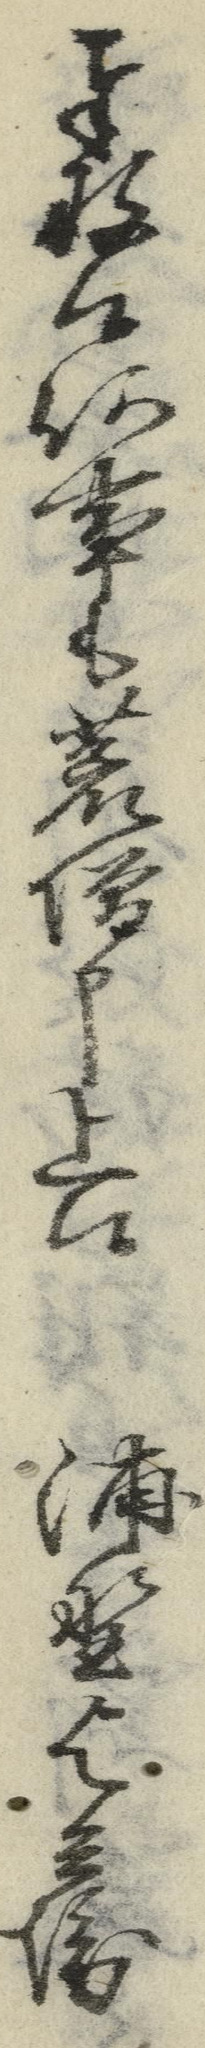奉存候何事も荒増申上候浦野与兵衛
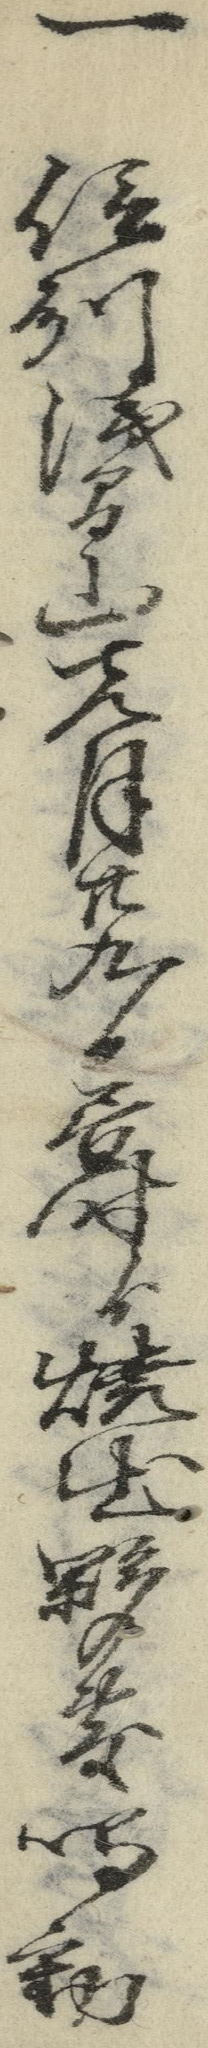一信州浅間山先月廿九日昼時ゟ焼出夥敷鳴動

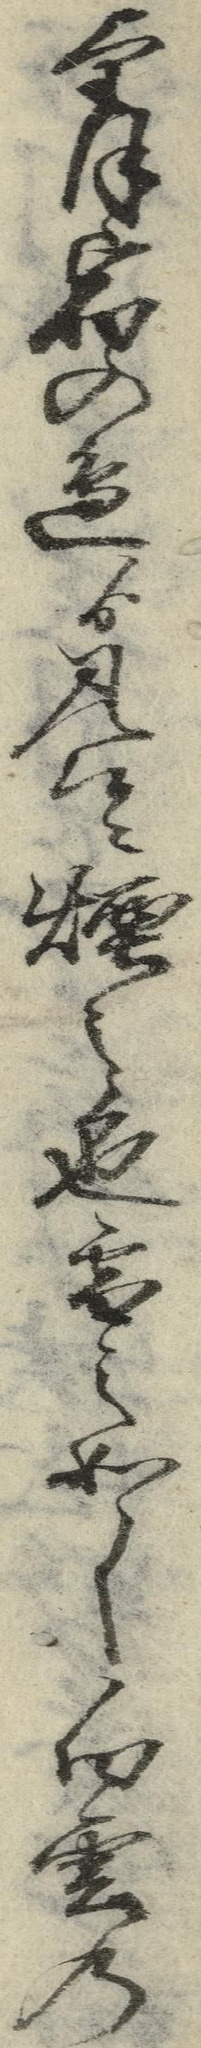望月宿の辺ゟ見候ニ煙之色雪之如く白雲乃
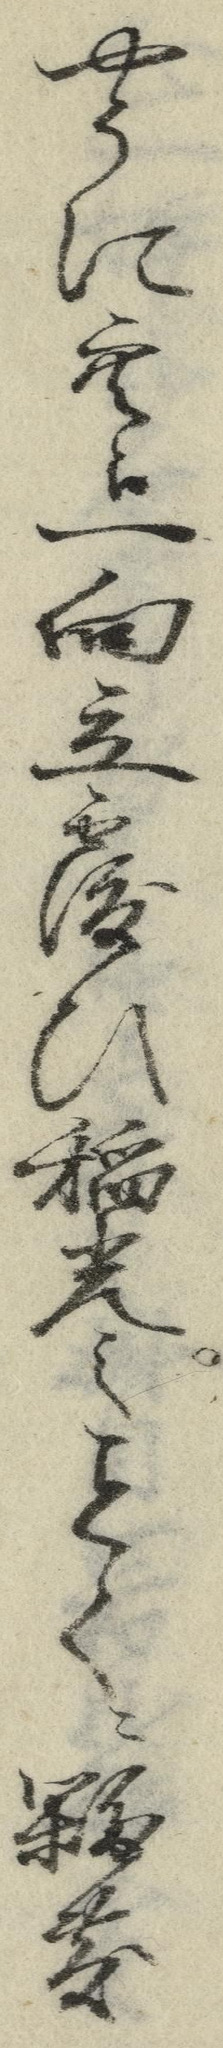やうに空江一向立覆ひ稲光之ことくニ夥敷
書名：信州浅間山焼
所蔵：東京大学地震研究所図書室 Earthquake Research Institute Library, The University of Tokyo, JAPAN
